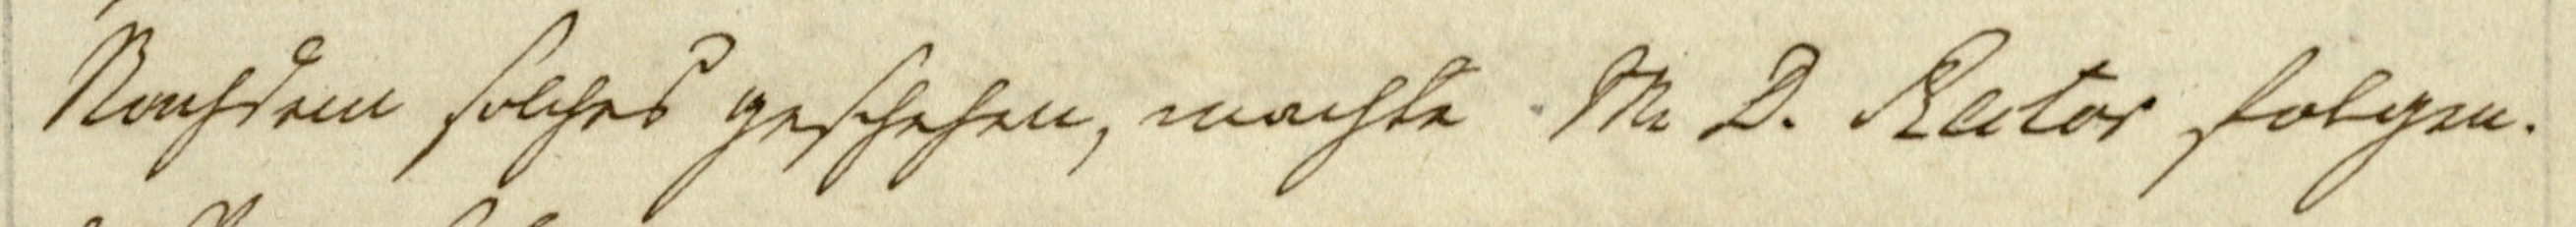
Nachdem solches geschehen, machte M. D. Rector folgen¬
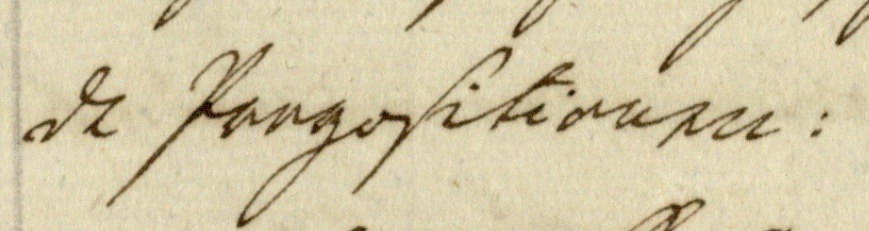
de Propositionen:
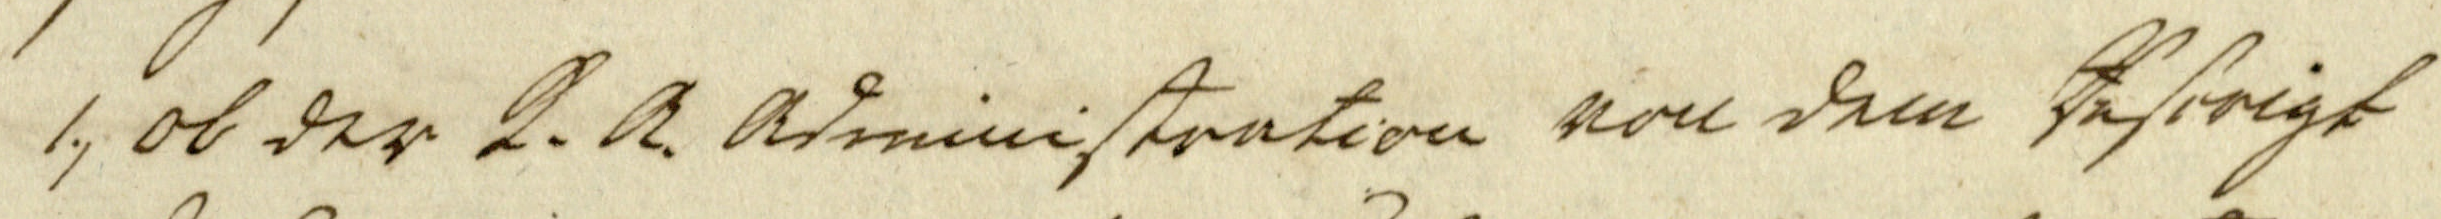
1., ob der K. A. Administration von dem Rescript
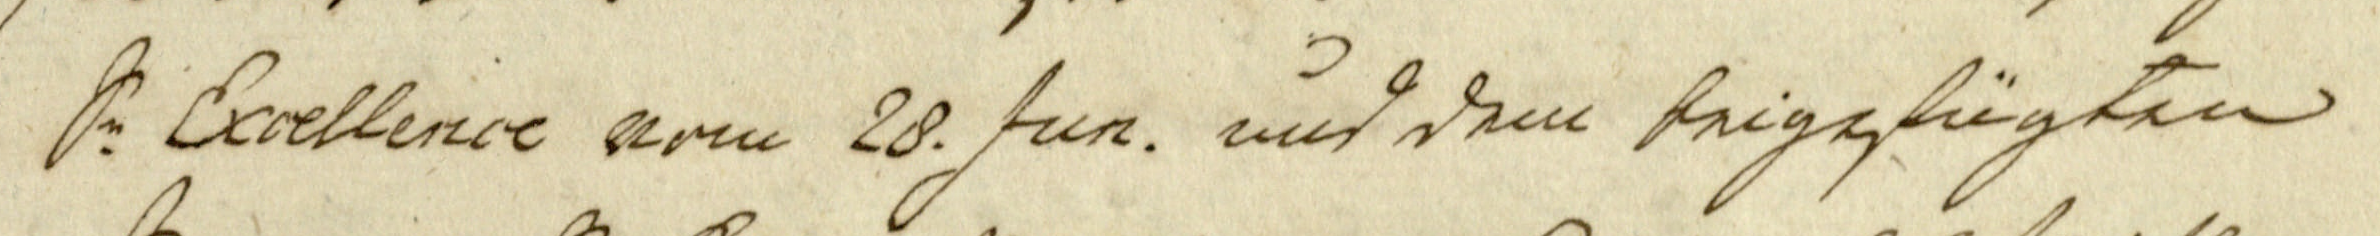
Sr. Excellence vom 28. Jun. und dem beigefügten
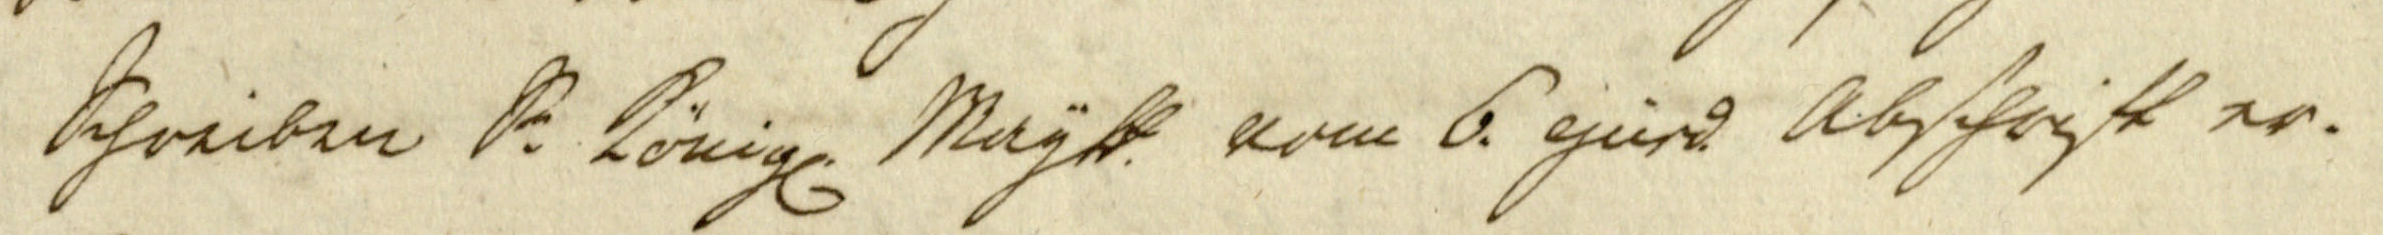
Schreiben Sr. Königl. Maÿtt. vom 6. ejusd. Abschrift er¬
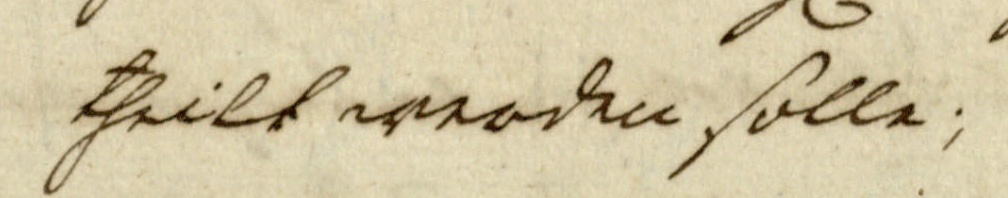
theilt werden solle;
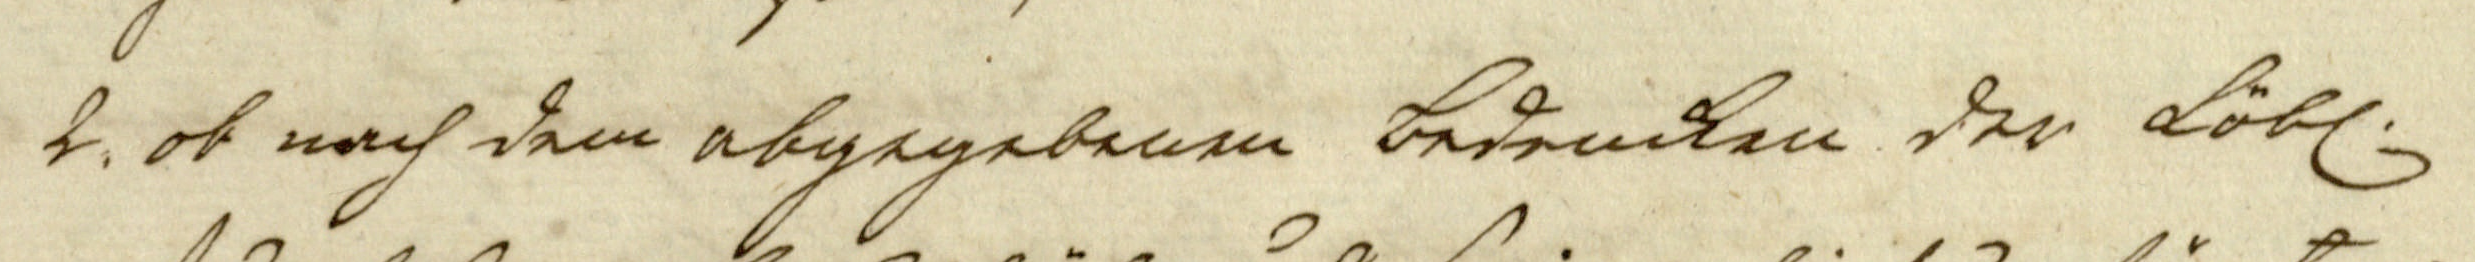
2., ob nach dem abgegebenen Bedencken der Löbl.
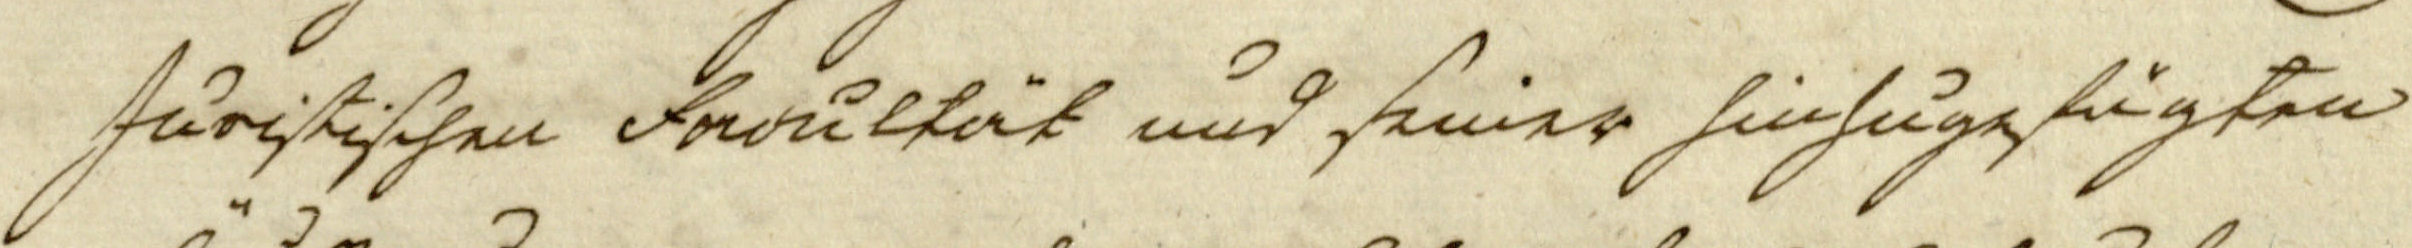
Juristischen Facultät und seiner hinzugefügten
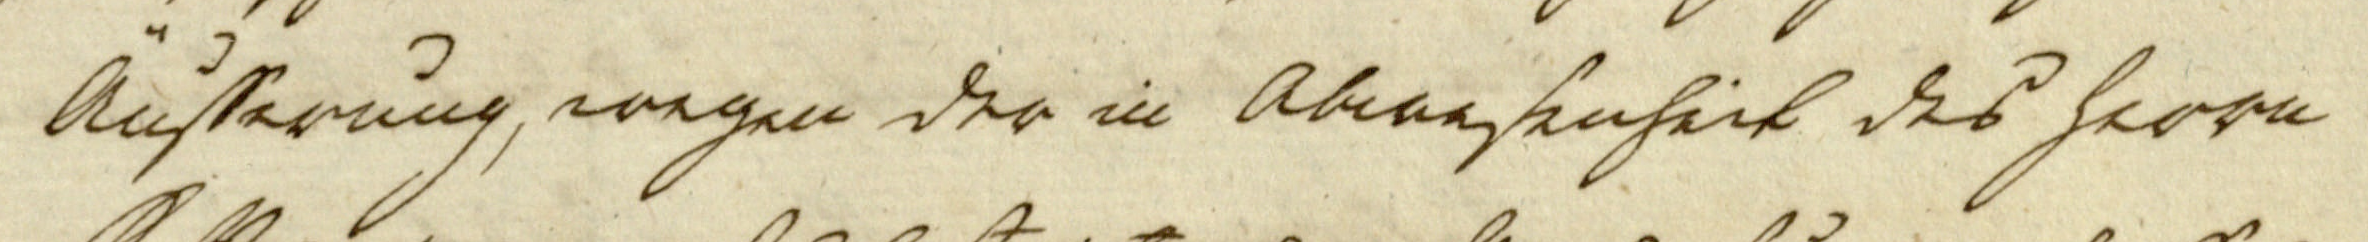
Äusserung, wegen der in Abwesenheit des herrn
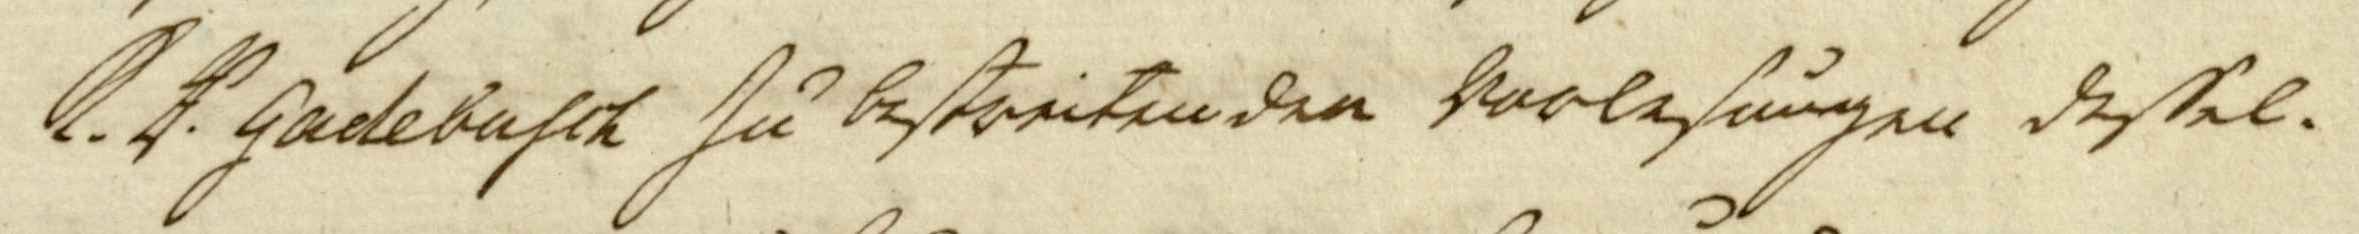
K. R. Gadebusch zu bestreitenden Vorlesungen dessel¬
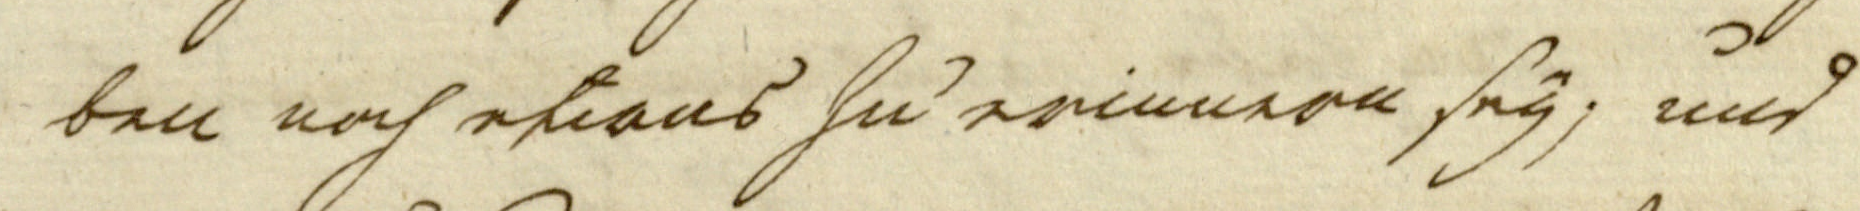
ben noch etwas zu erinnern seÿ, und
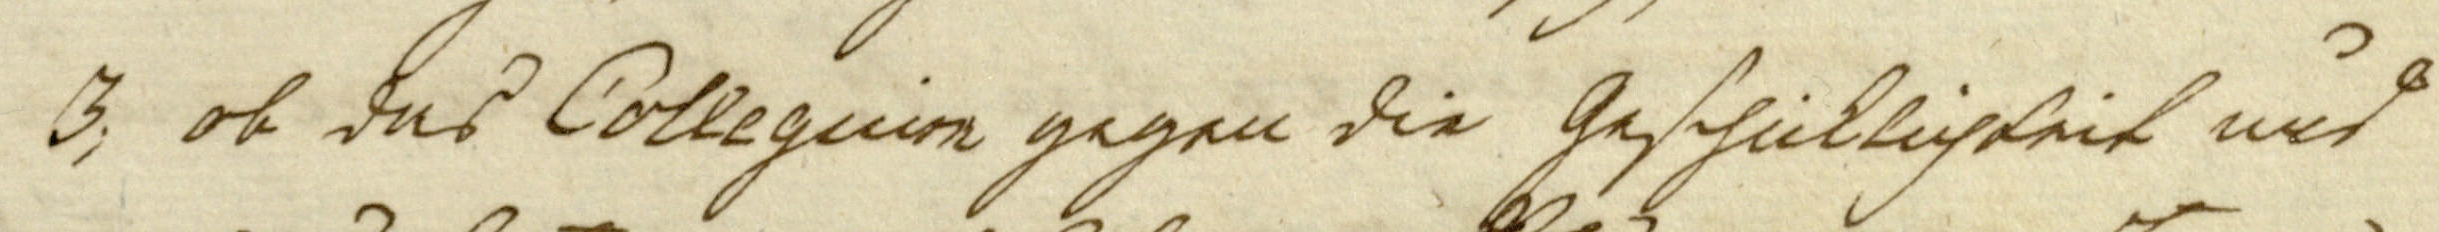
3., ob das Collegium gegen die Geschicklichkeit und
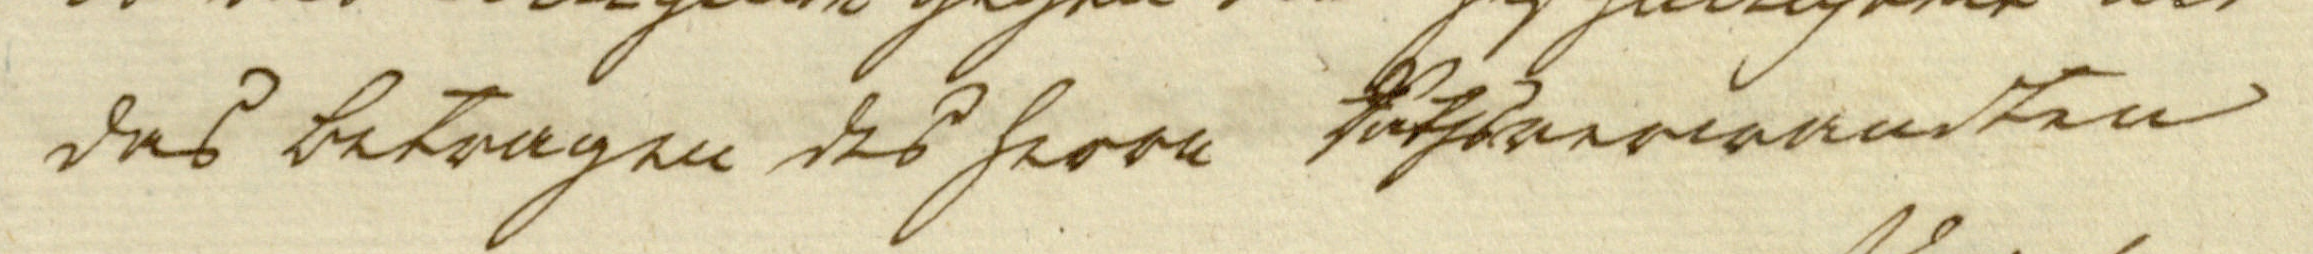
das Betragen des herrn Rathsverwandten
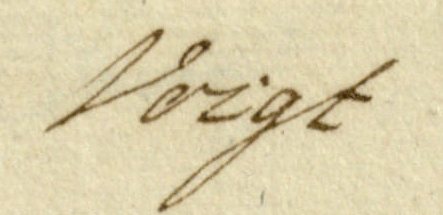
Voigt
